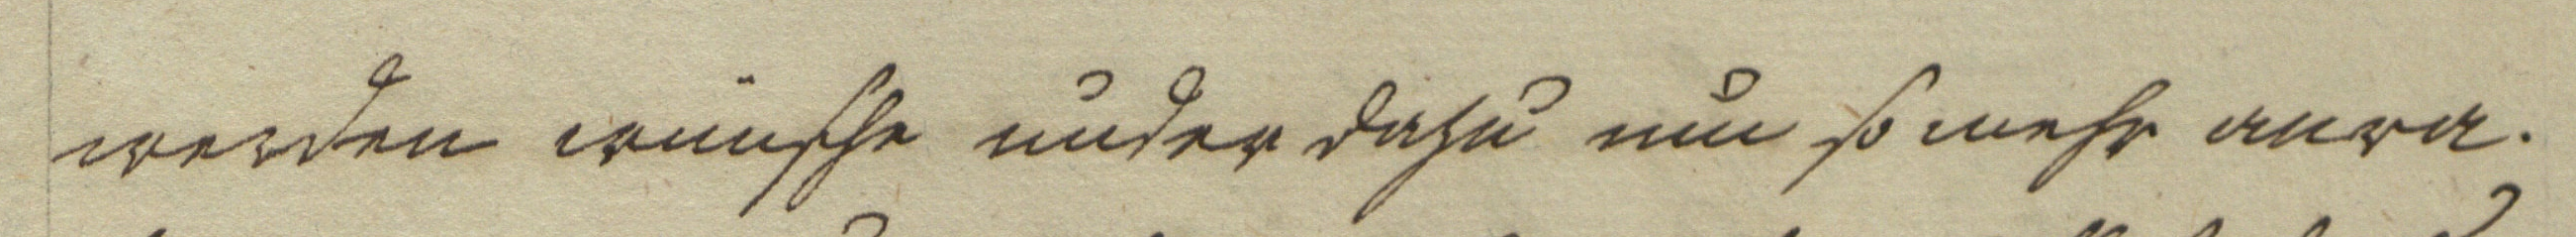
werden wünsche und er dazu um so mehr anra¬
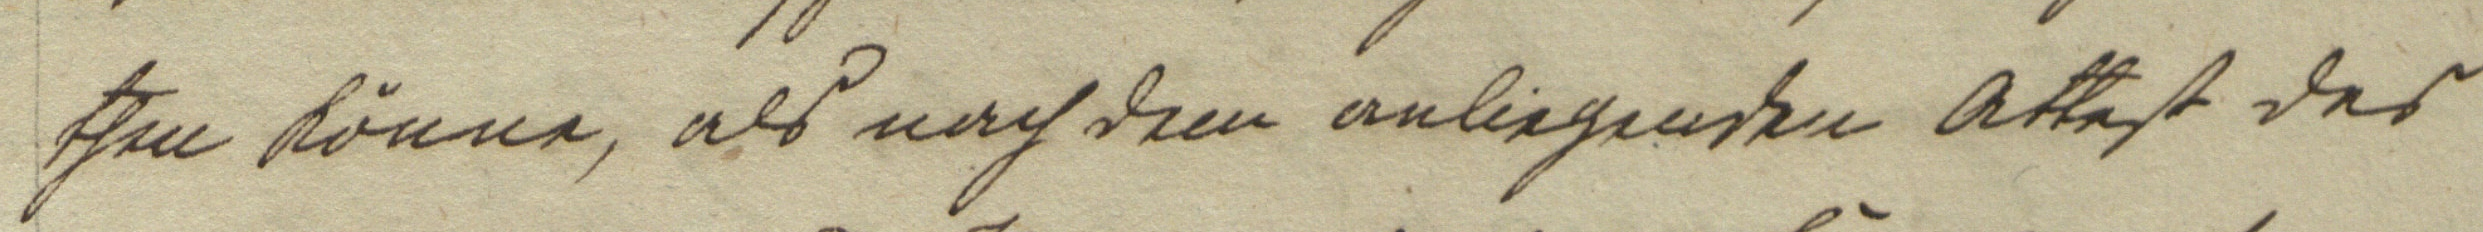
ten könne, als nach dem anliegenden Atteste des
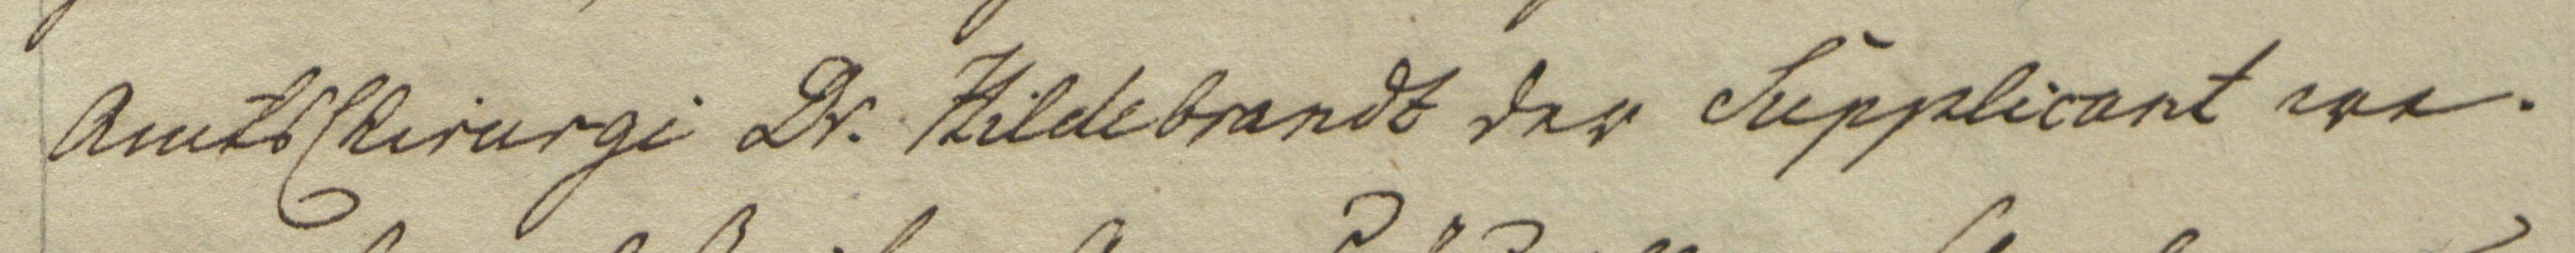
AmtsChirurgi Dn. Hildebrandt der Supplicant we¬
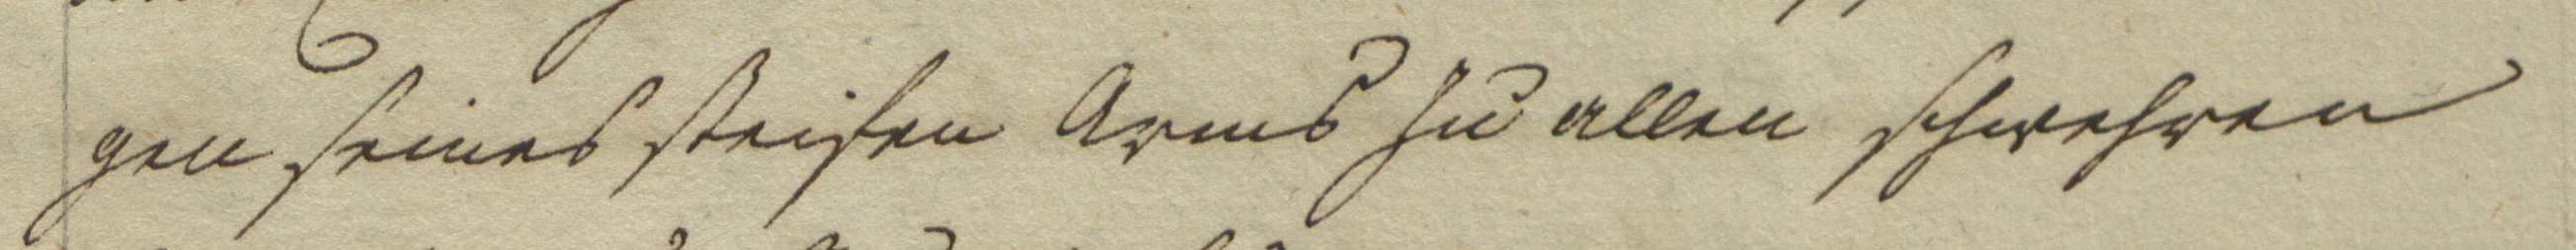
gen seines steifen Arms zu allen schwehren
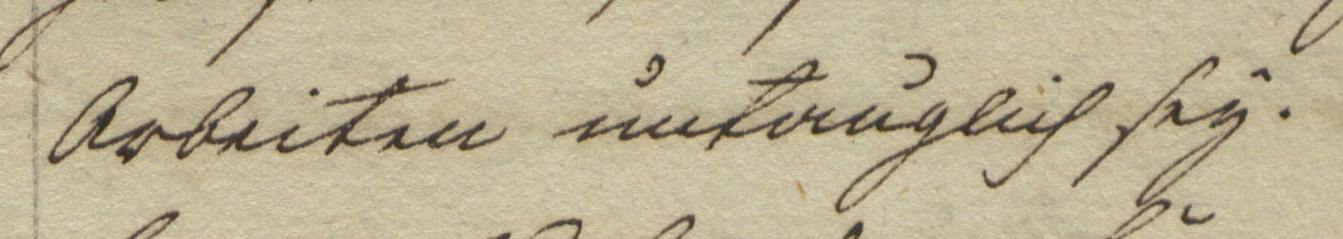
Arbeiten untauglich seÿ.
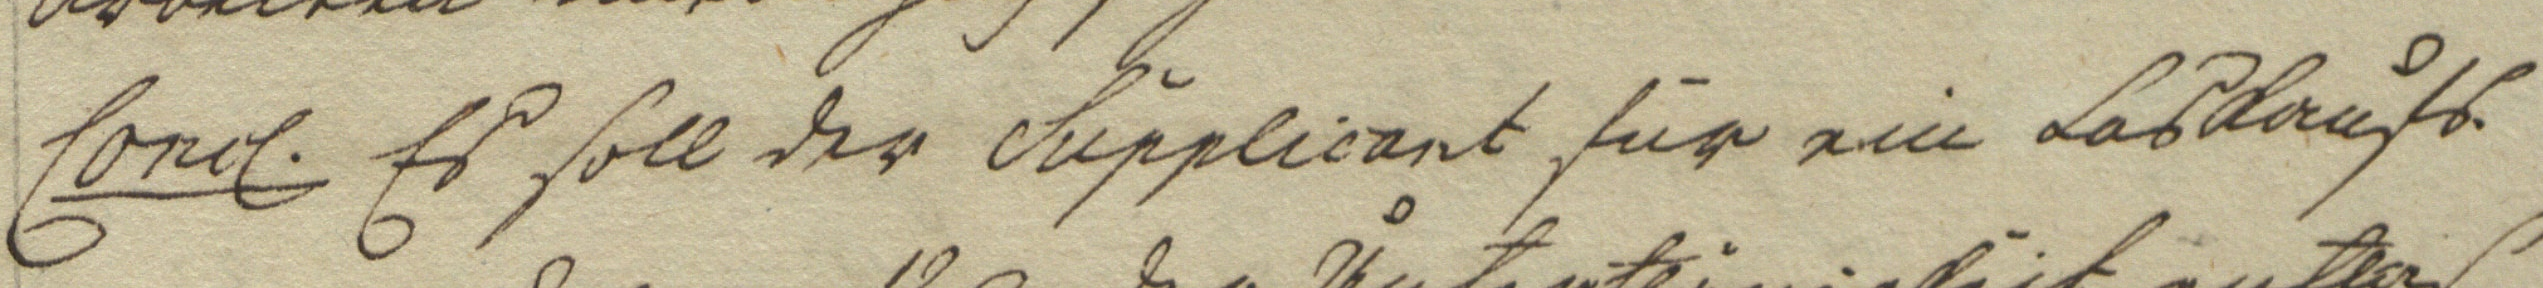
Concl Es soll der Supplicant für ein Loskaufs¬
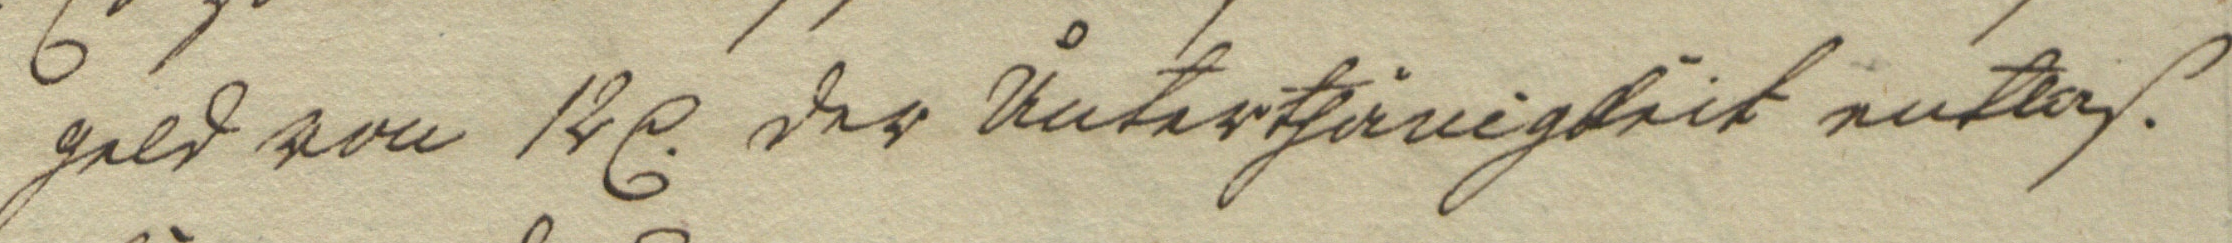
geld von 12 l. der Unterthänigkeit entlas¬
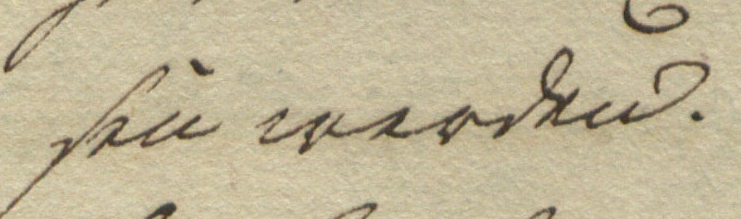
sen werden.
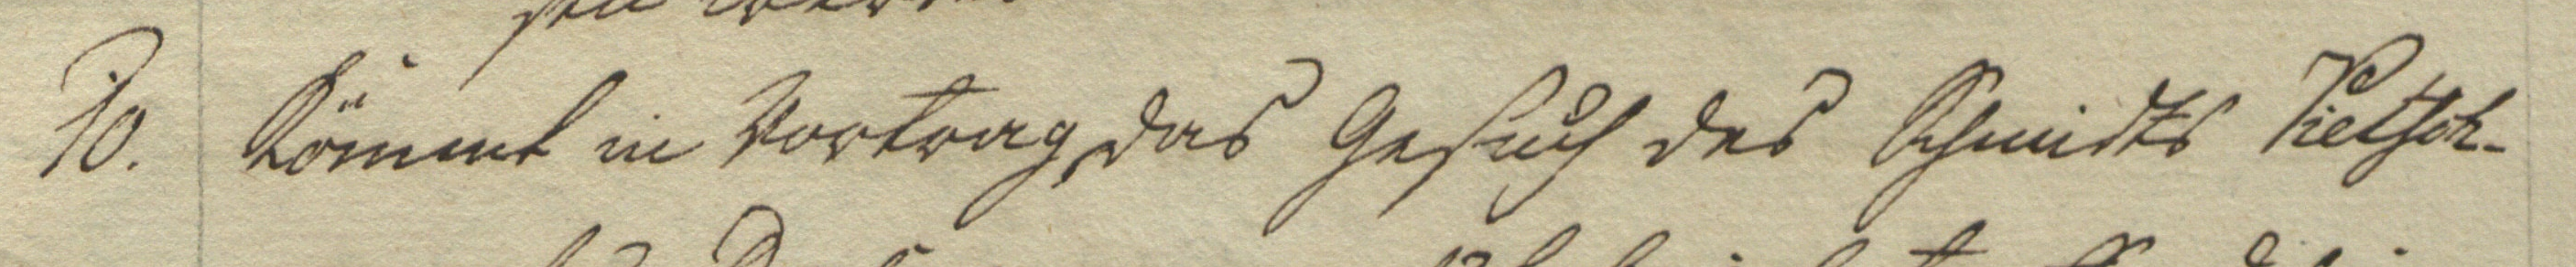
10. Kömmt in Vortrag, das Gesuch des Schmidts Pietsch¬
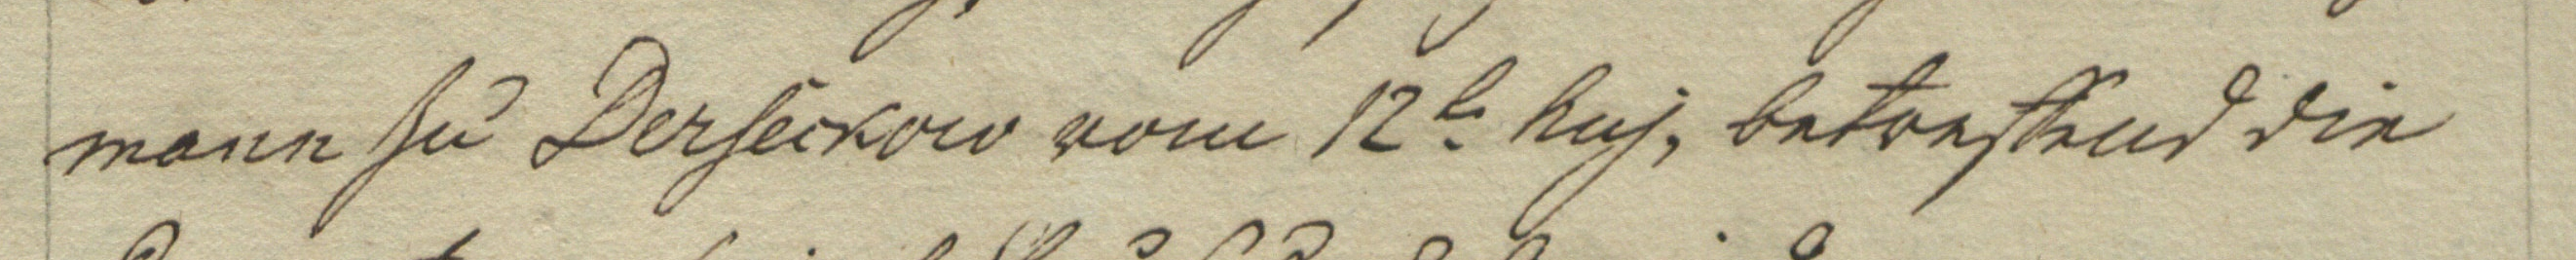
mann zu Derseckow vom 12 t. huj. betreffend die
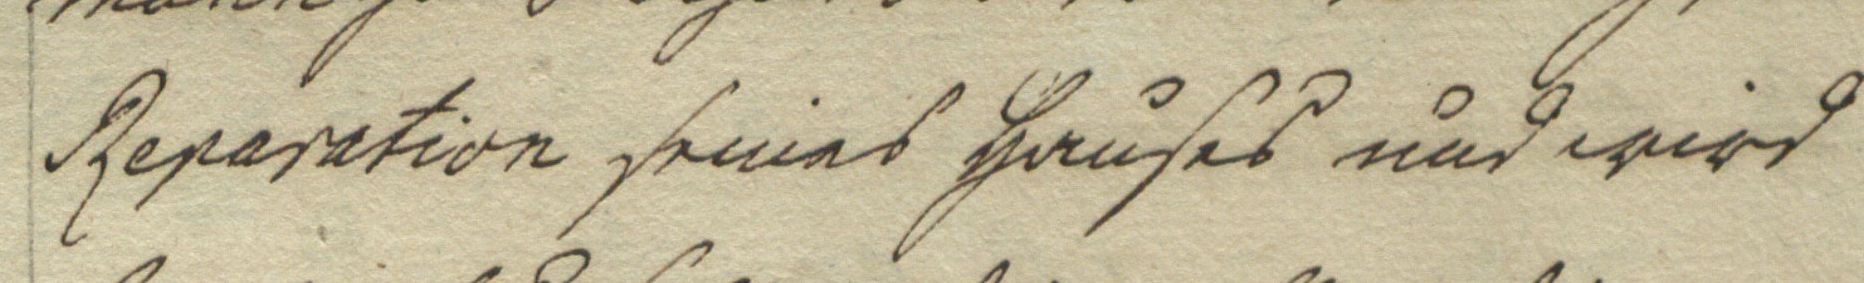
Reparation seines Hauses und wird
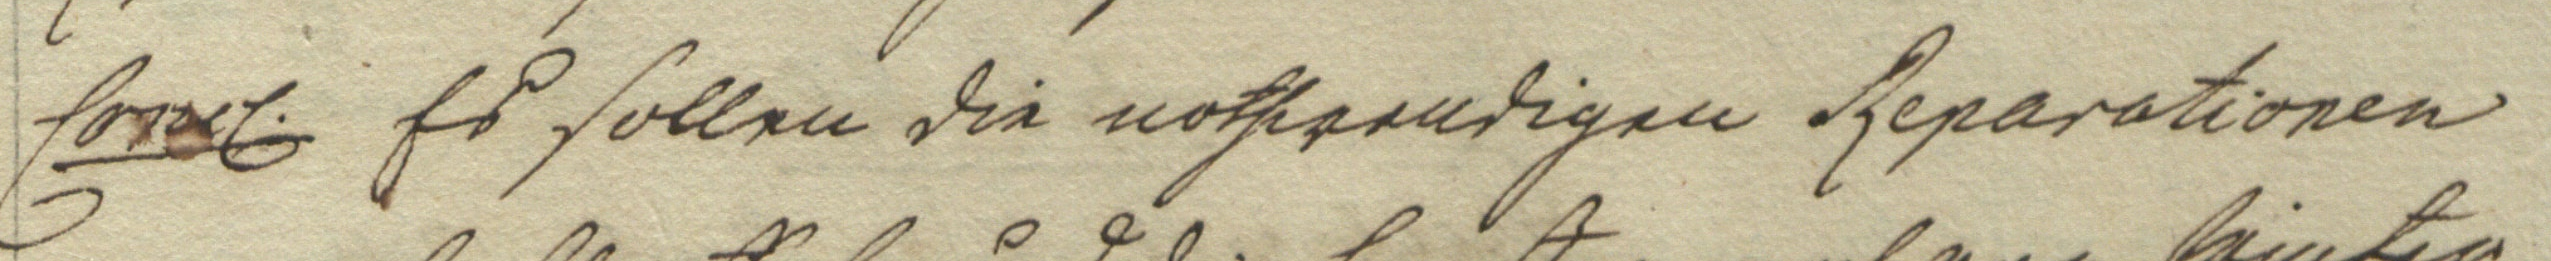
Concl Es sollen die nothwendigen Reparationen
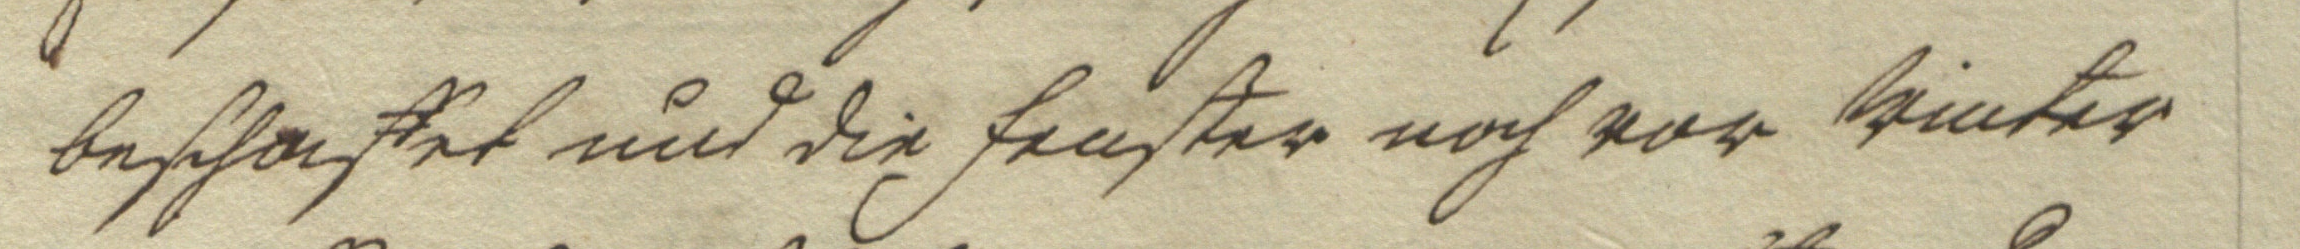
beschaffet und die Fenster noch vor Winter
